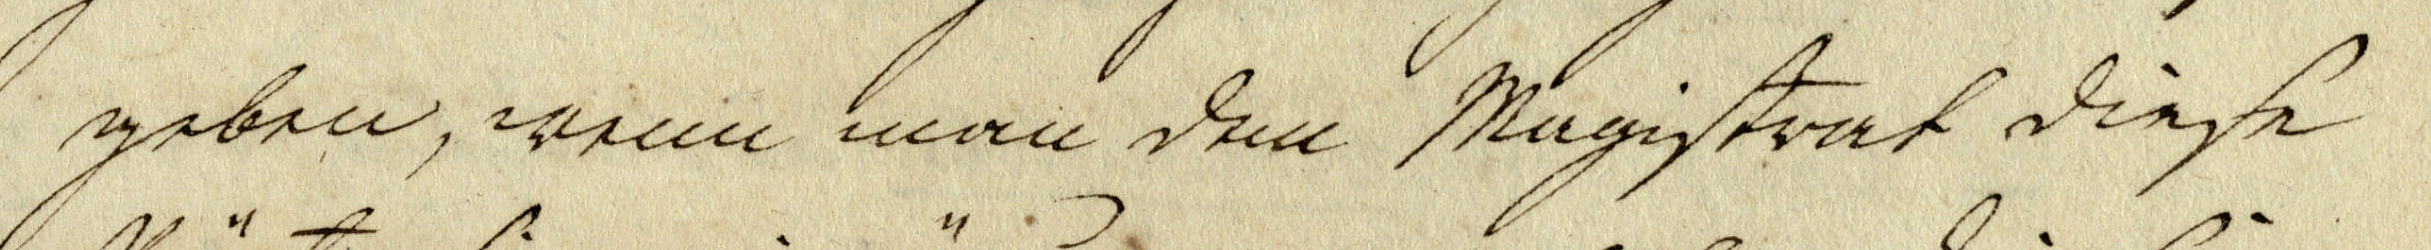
geben, wenn man dem Magistrat diese
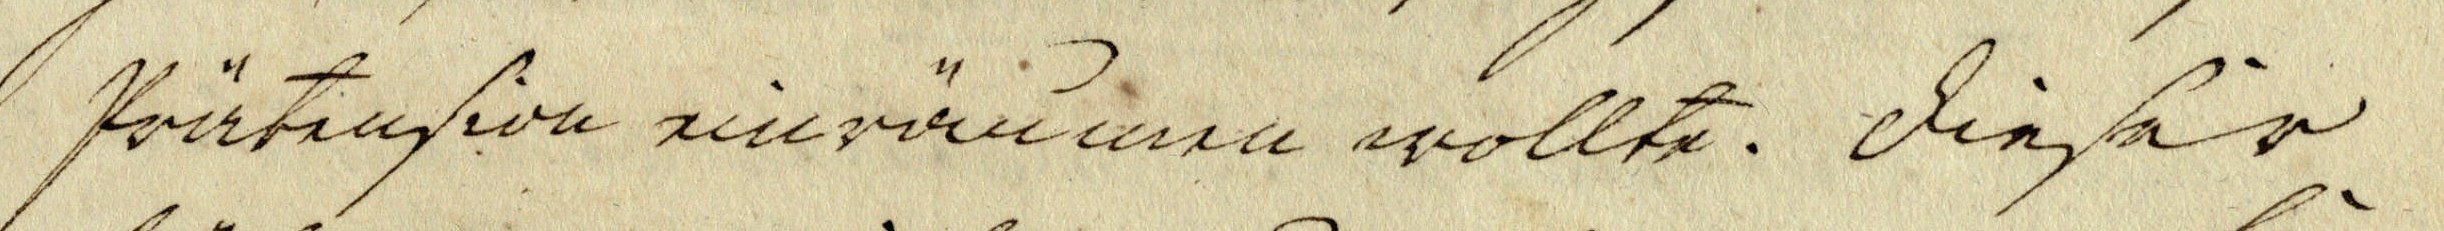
Prätension einräumen wollte. Dieser
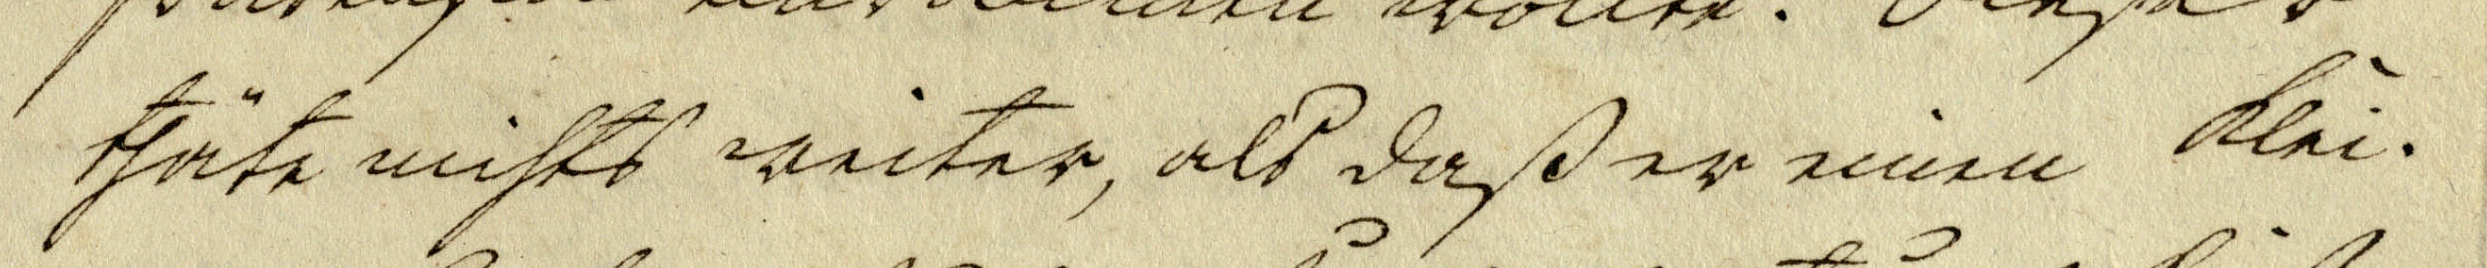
thäte nichts weiter, als daß er einen klei¬
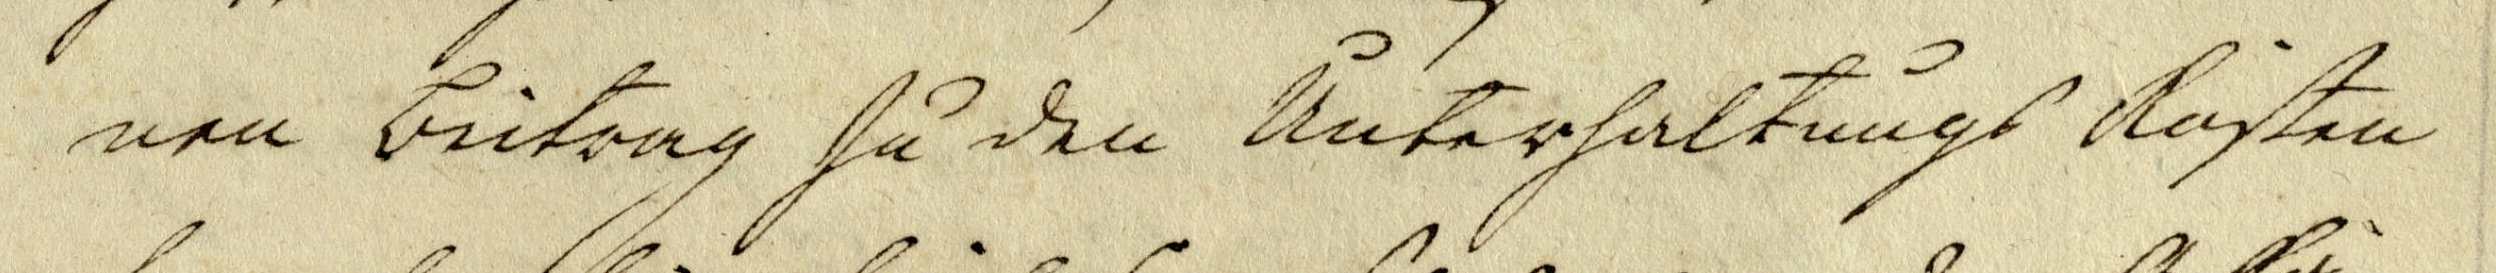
nen Beitrag zu den Unterhaltungs Kosten
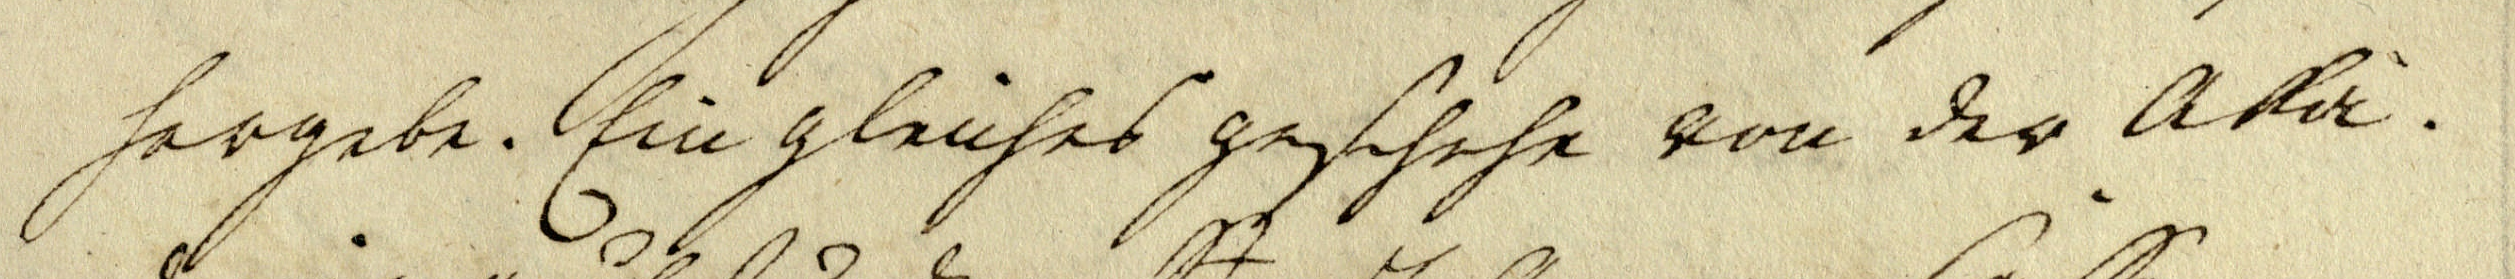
hergebe. Ein gleiches geschehe von der Aka¬
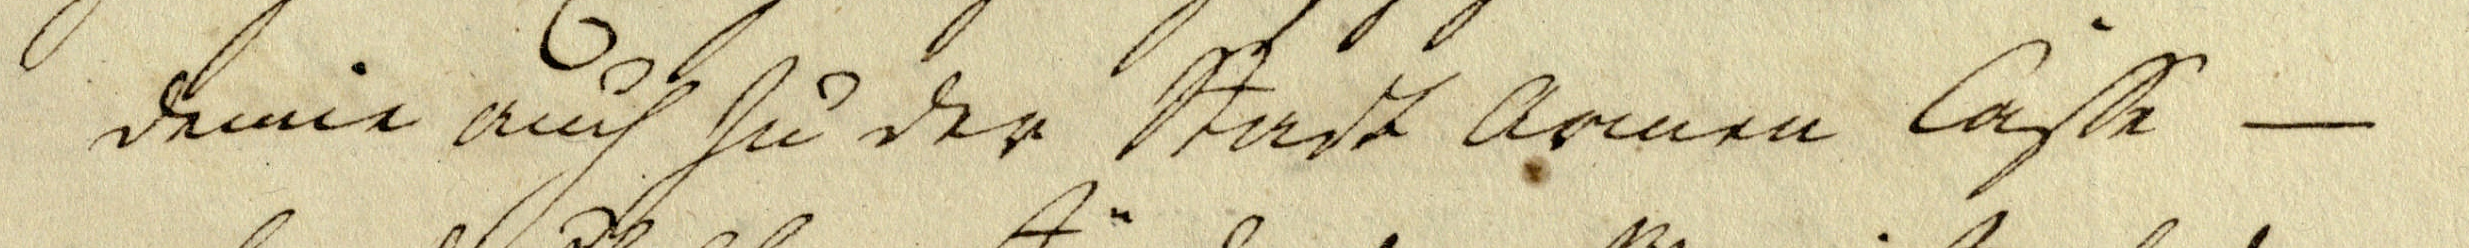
demie auch zu der Stadt Armen Casse -
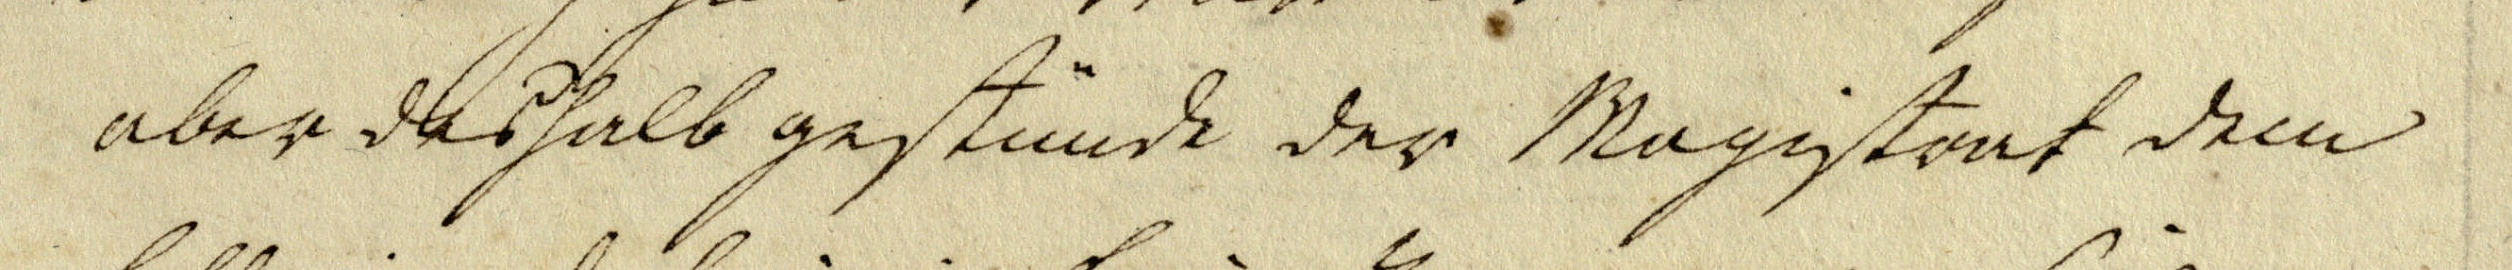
aber deshalb gestünde der Magistrat dem
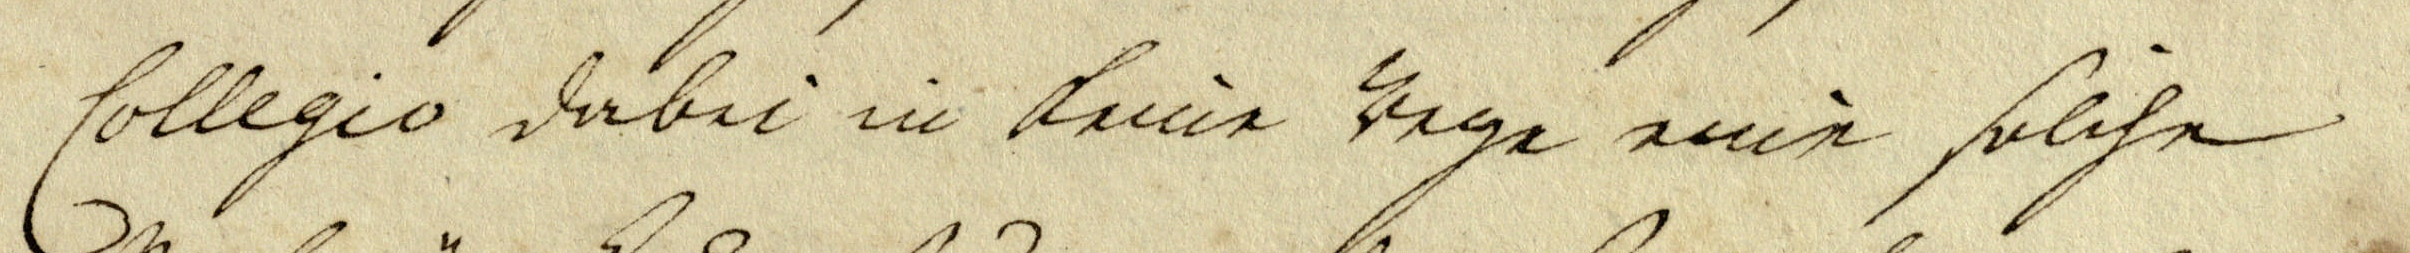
Collegio dabei in keine Wege eine solche
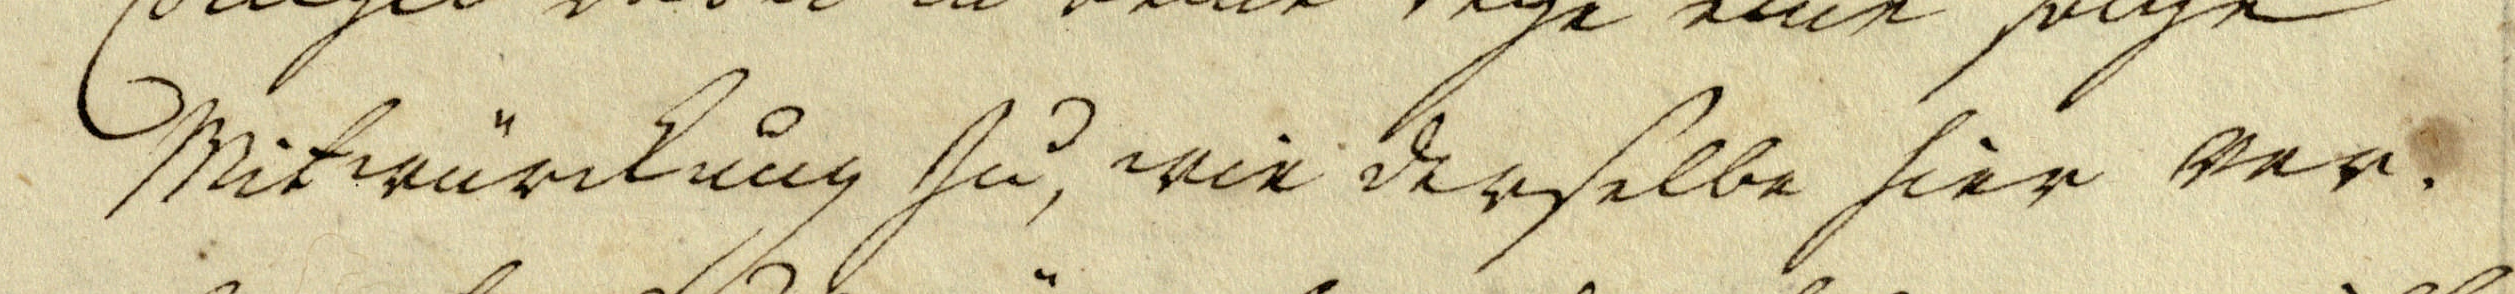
Mitwürckung zu, wie derselbe hier ver¬
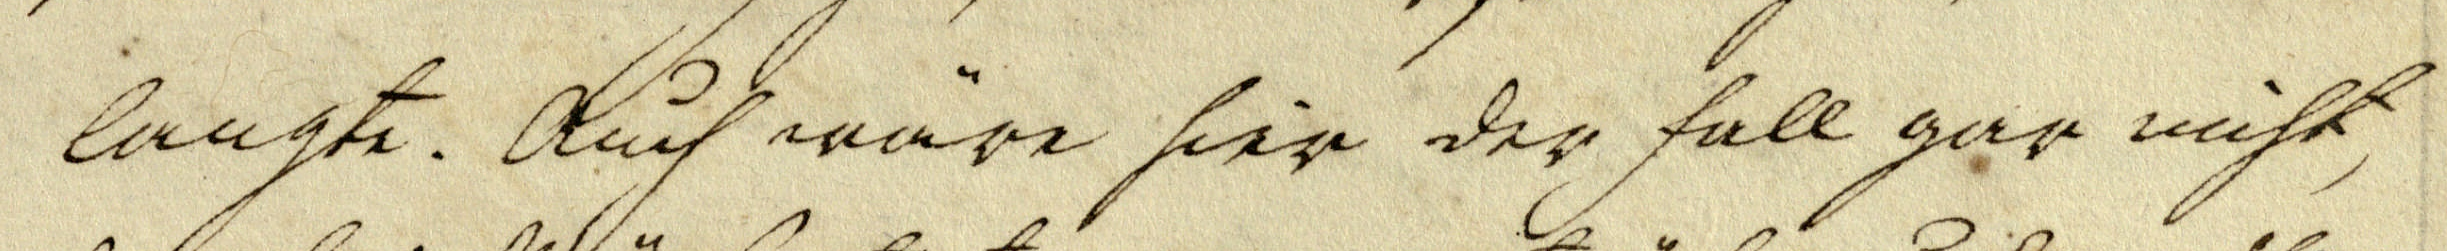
langte. Auch wäre hier der Fall gar nicht,
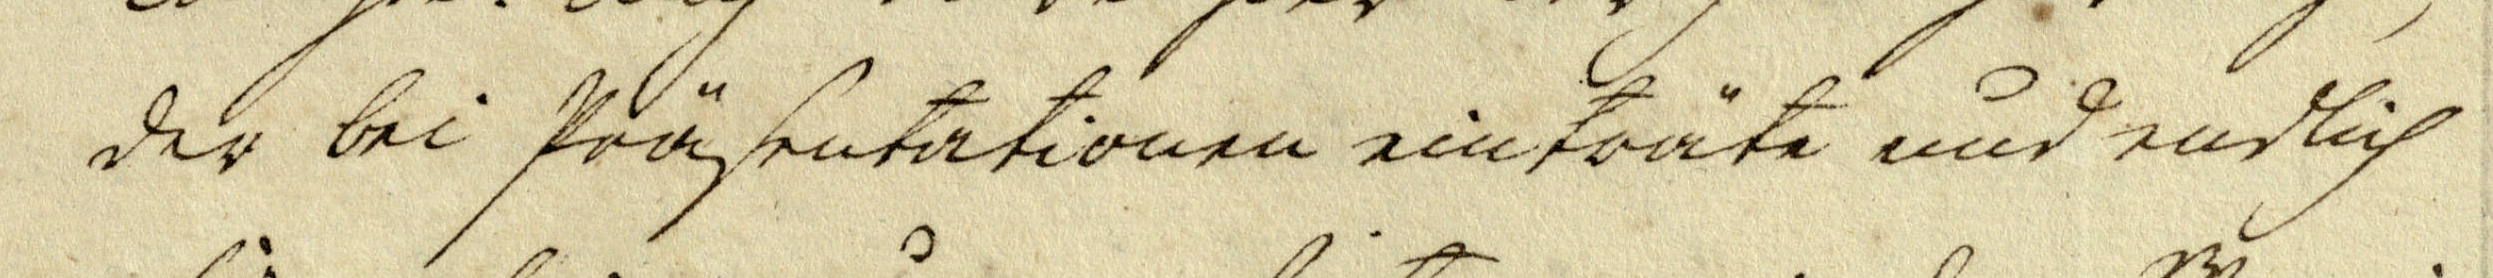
der bei Präsentationen einträte und endlich
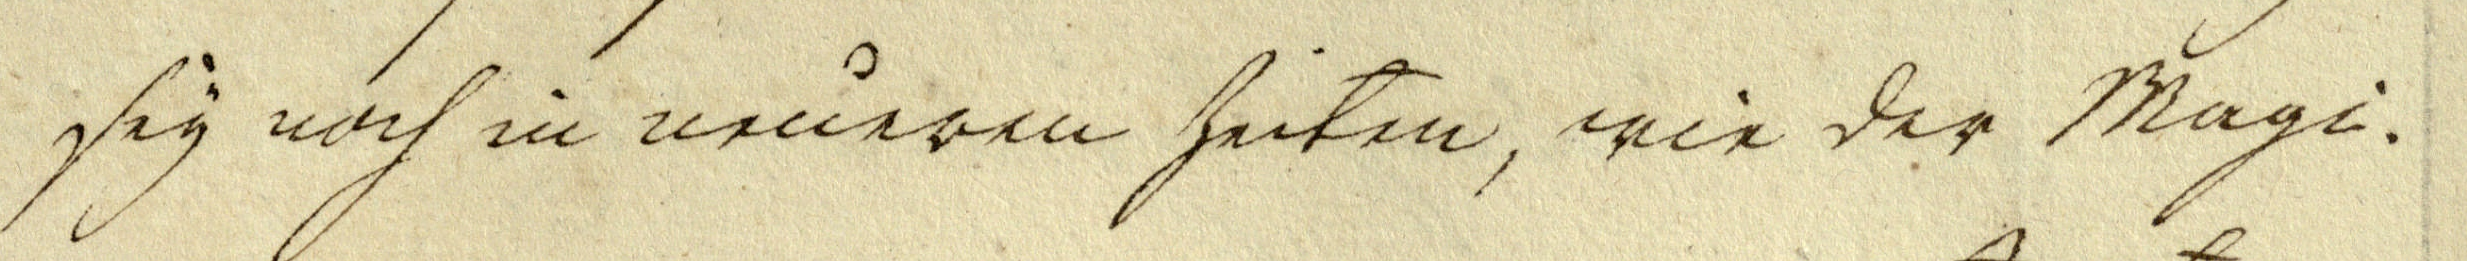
seÿ noch in neueren Zeiten, wie der Magi¬
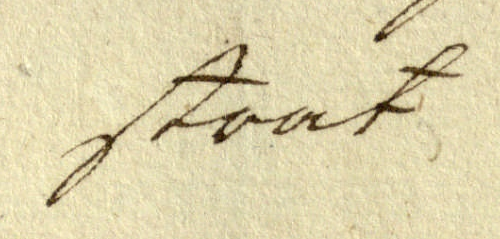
strat
